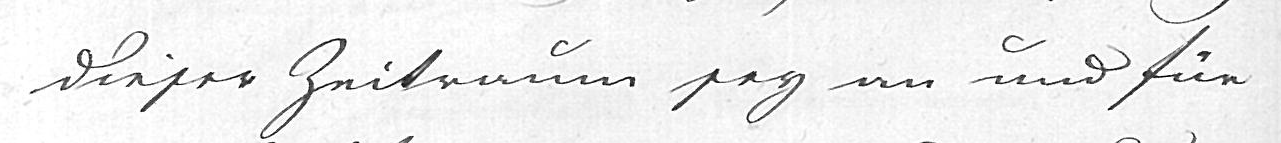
dieser Zeitraum sey an und für
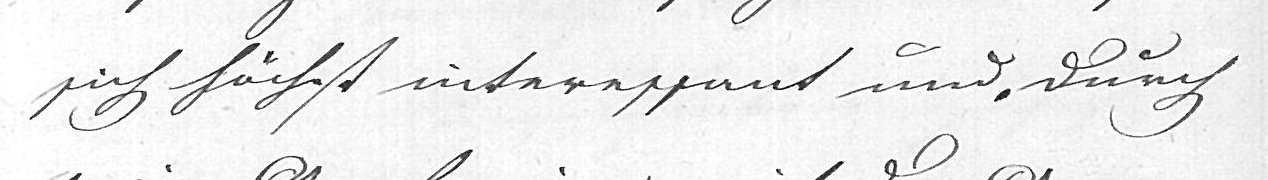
sich höchst interessant und, durch
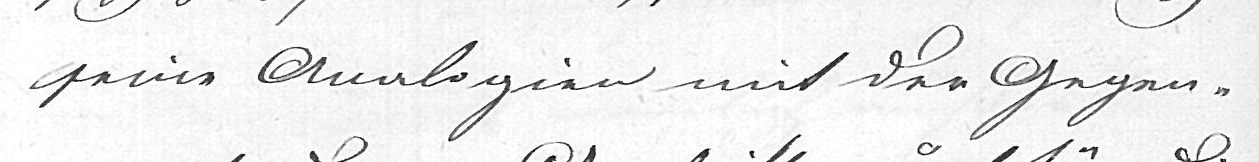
seine Analogien mit der Gegen-
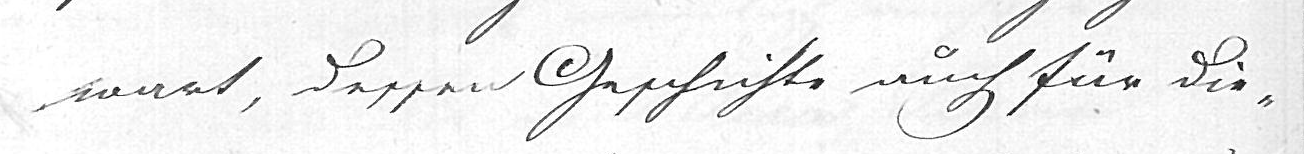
wart, dessen Geschichte auch für die-
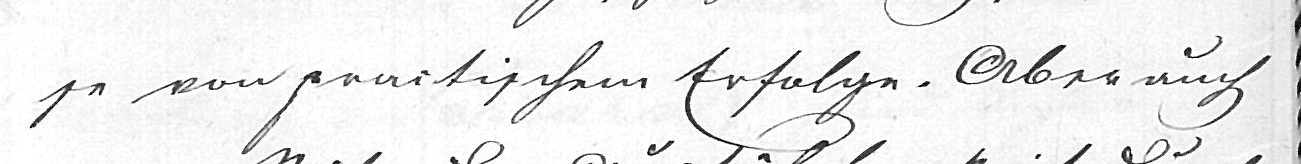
se von practischem Erfolge. Aber auch
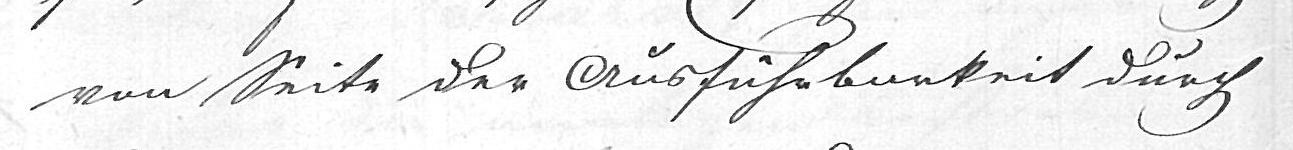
von Seite der Ausführbarkeit durch
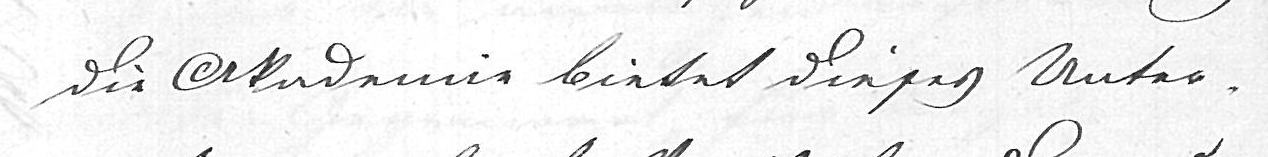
die Akademie bietet dieses Unter-
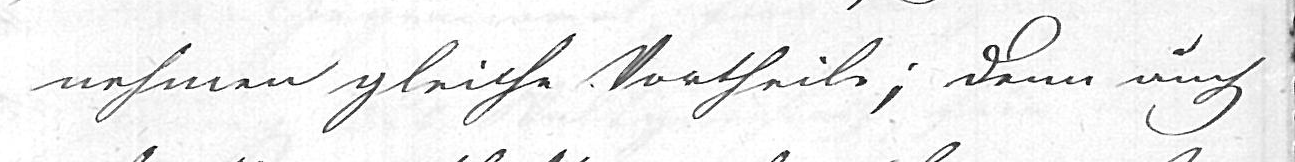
nehmen gleiche Vortheile; denn auch
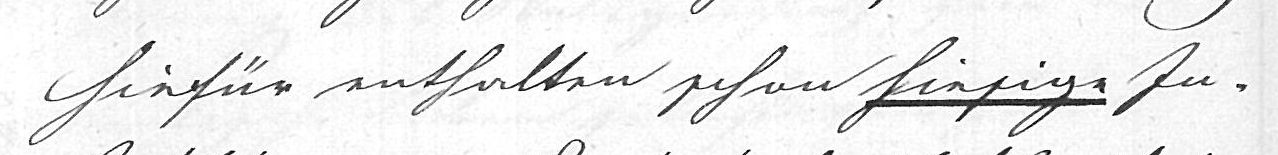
hiefür enthalten schon hiesige In-
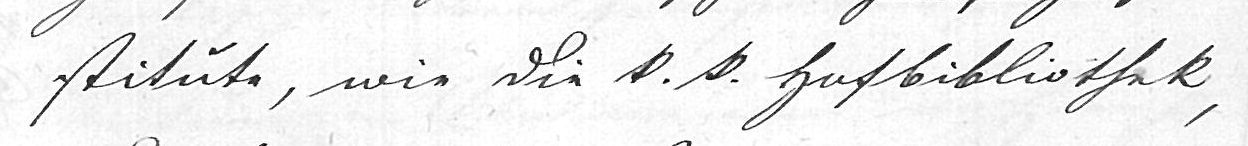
stitute, wie die k.k. Hofbibliothek,
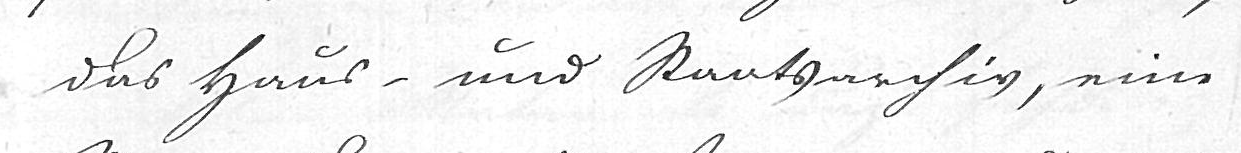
das Haus- und Staatsarchiv, eine
